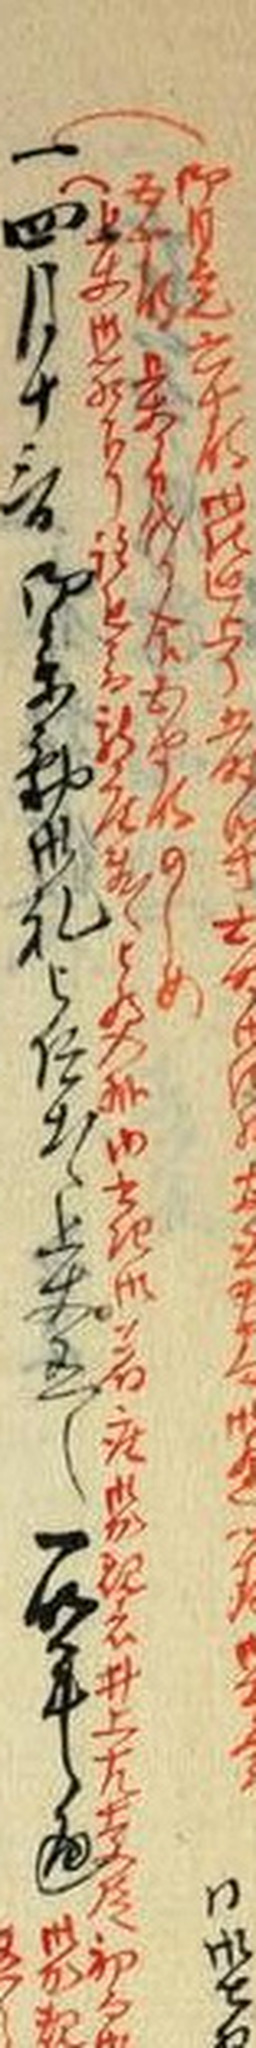一四月十三日御参勤御礼被仰出候上使有之一昨年之通
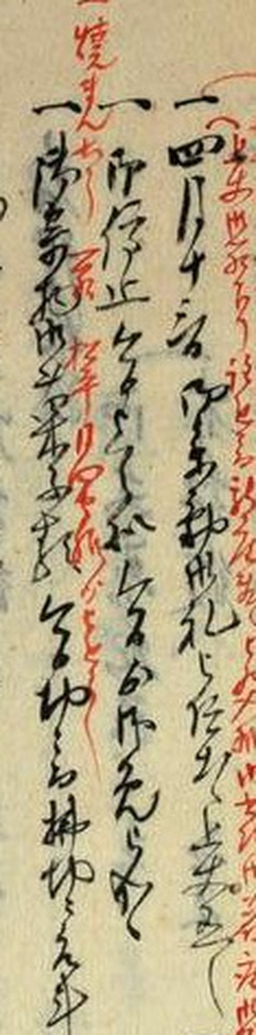一御停止今日迄候処今日ゟ御免被成候
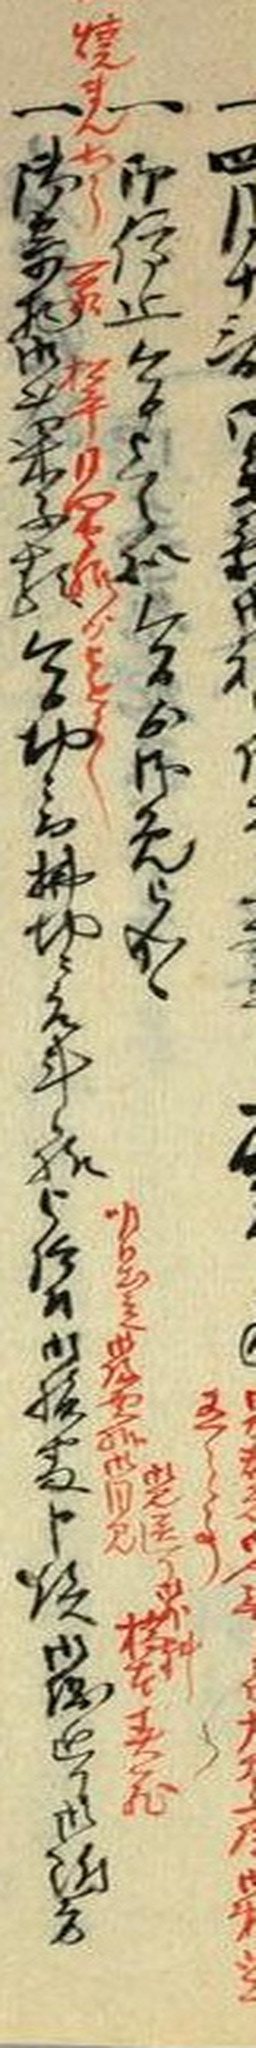一御寄物御菓子類今日切ニ而払切ニ取計候様被仰付御膳番申談御側廻り御附方
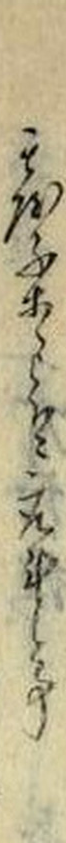其後子等へ被進下ニ取計候事
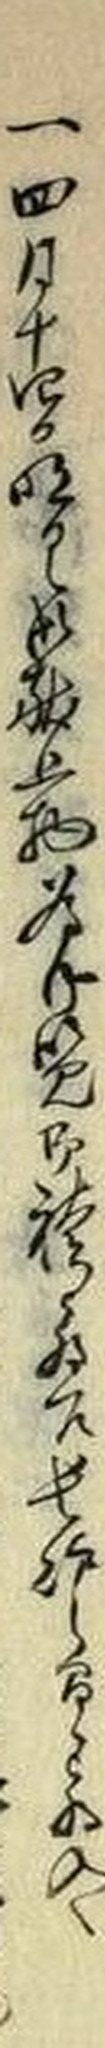一四月十四日明日之御献上物為御覧御袴被為召長炉之間へ被為入候
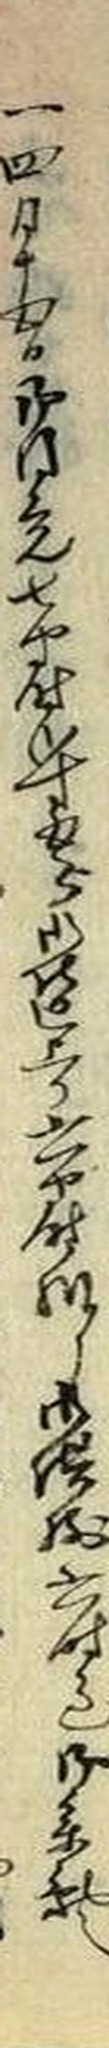一四月十五日御目覚七半時弐寸五分御仕廻上り六半時掛り御供揃六時過御参勤之
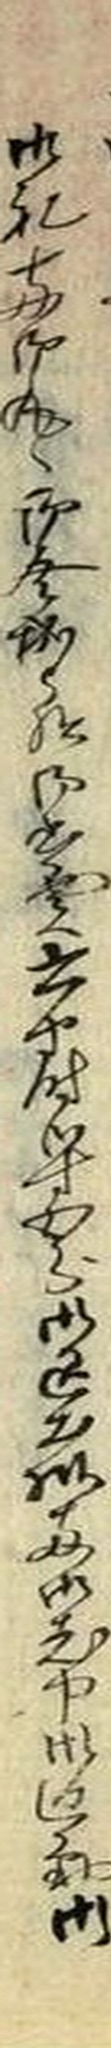御礼両御丸へ御登城被遊御出殿六半時弐寸五分御退出掛両御老中御廻勤御
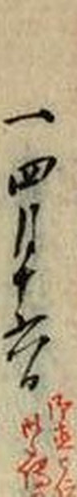一四月十六日
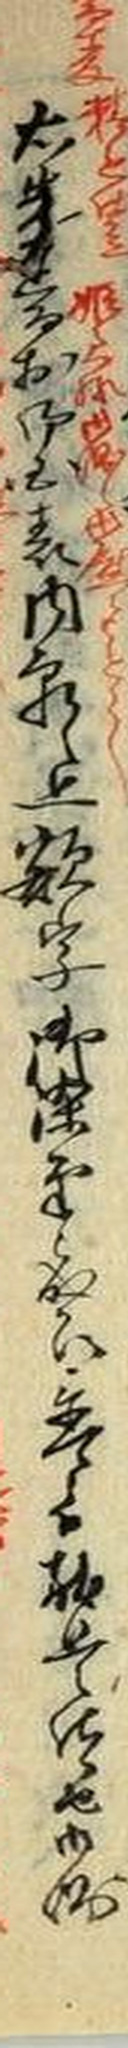右先達而於御国表内願之上額字御染筆被成下置ニ付献上之仕候由御側
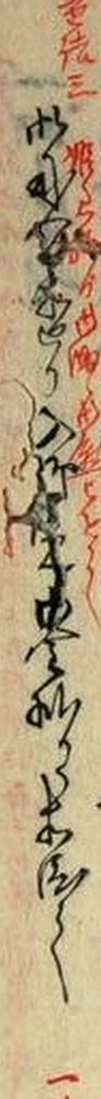御用人ゟ相廻り入御覧御金掛りへ相渡之

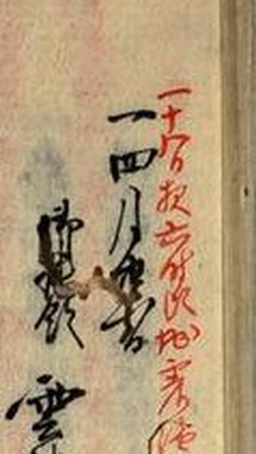一四月廿一日
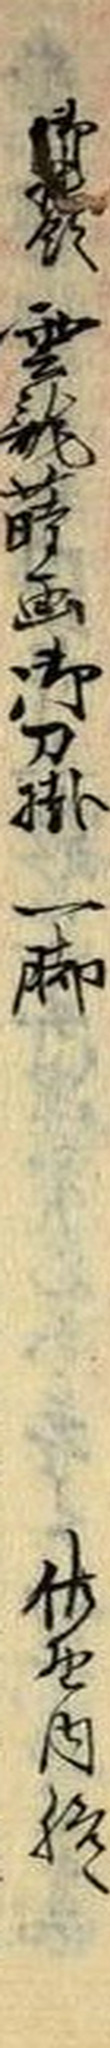御拝領雲龍蒔絵御刀掛一脚佐野内膳へ
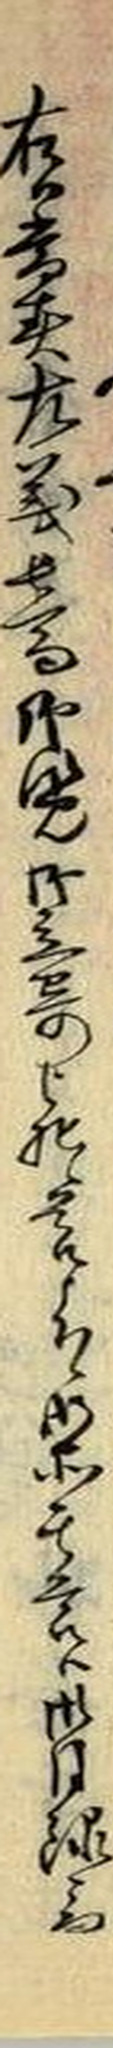右ハ当春左義長馬御覧御立寄被遊候節被下候御品其節ハ御目録ニ而
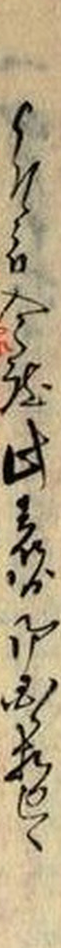被下ニ付今度此表ゟ御国へ相廻候
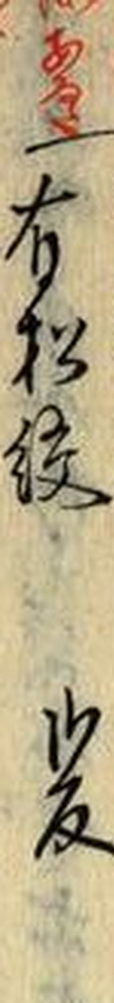有松絞壱反
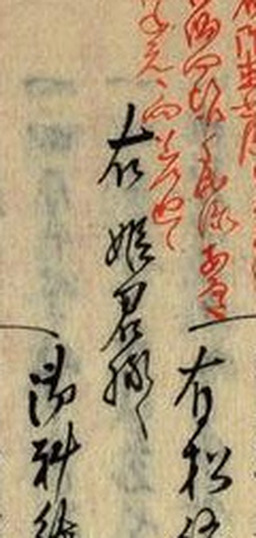右姫君様へ
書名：少傅日録抄（斉承付側向頭取日記、在府）
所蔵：福井県文書館 Fukui Prefectural Archives
